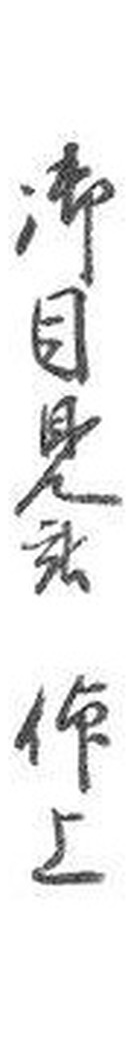御目見被仰上
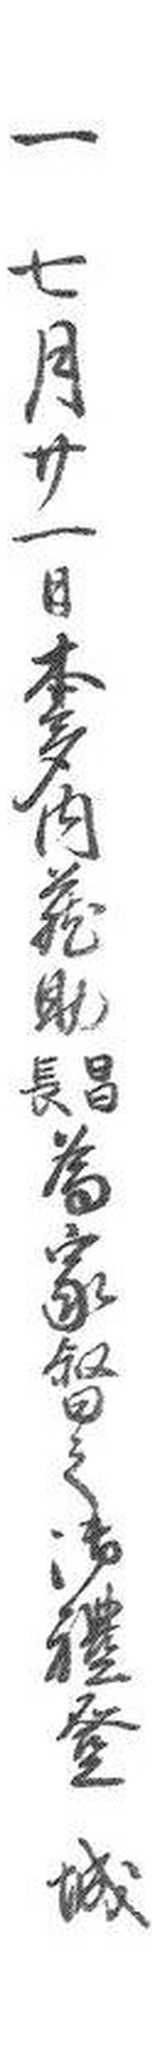一七月廿一日本多内蔵助昌長為家督之御礼登城
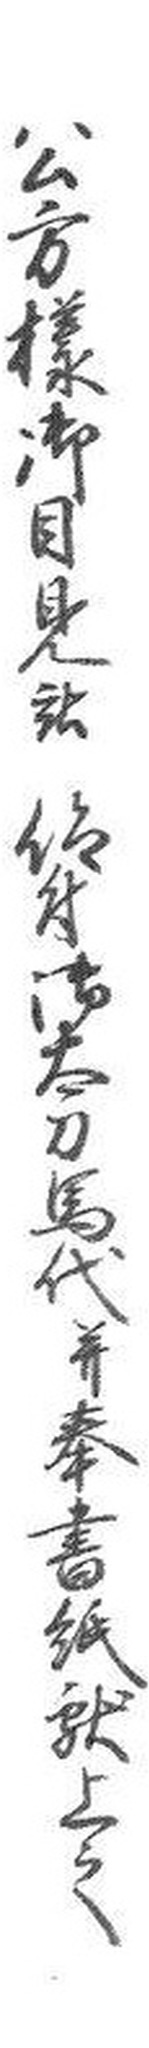公方様御目見被仰付御太刀馬代并奉書紙献上之
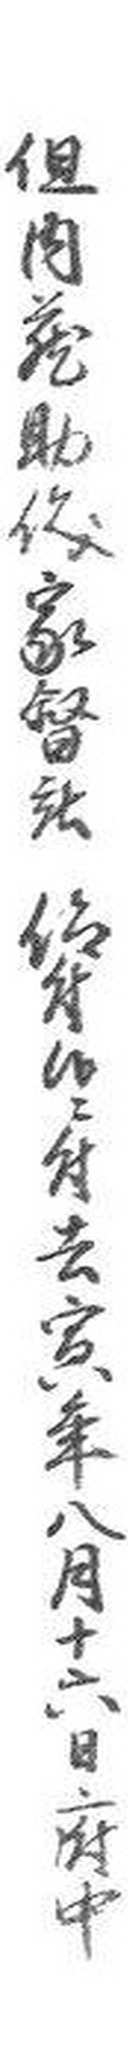但内蔵助儀家督被仰付候ニ付去寅年八月十六日府中
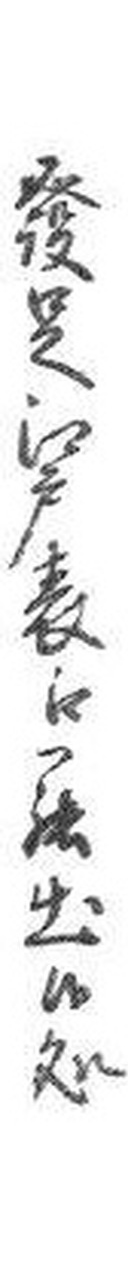発足江戸表江罷出候処
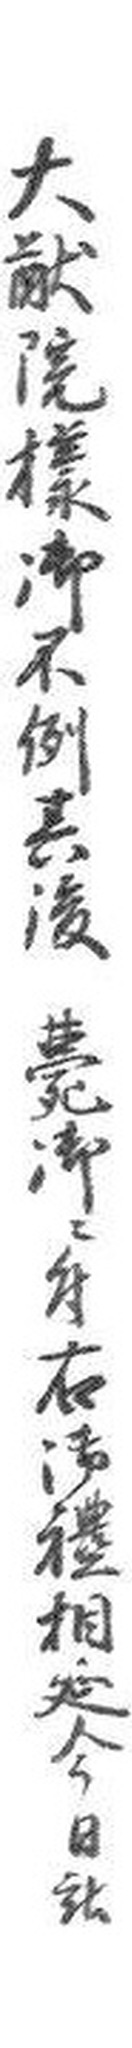大猷院様御不例其後薨去ニ付右御礼相延今日被
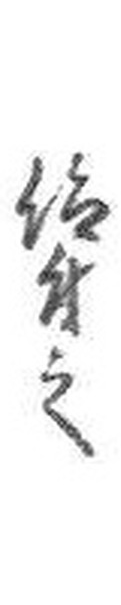仰付之
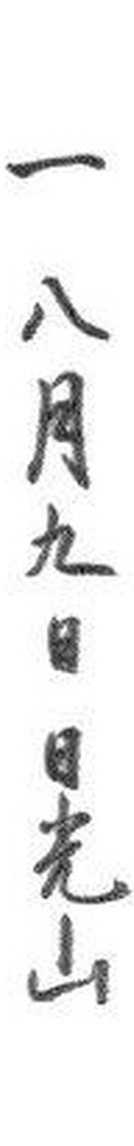一八月九日日光山
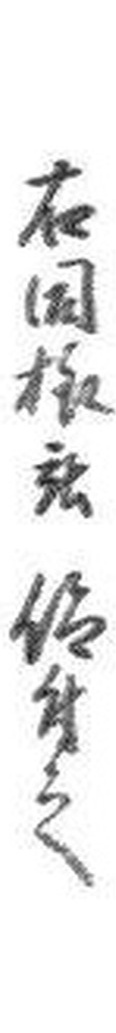右同被仰付之
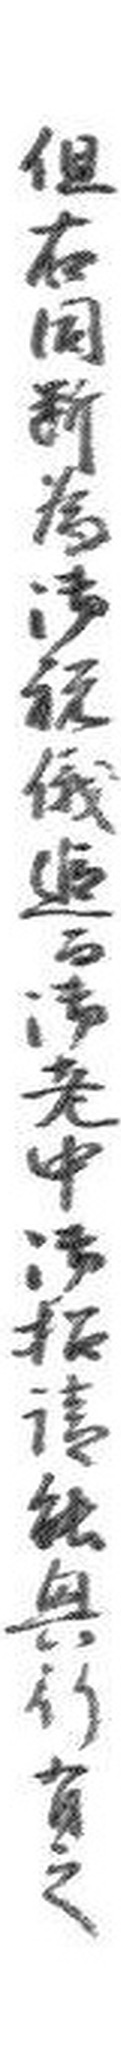但右同断為御祝儀追而御老中御招請能興行有之
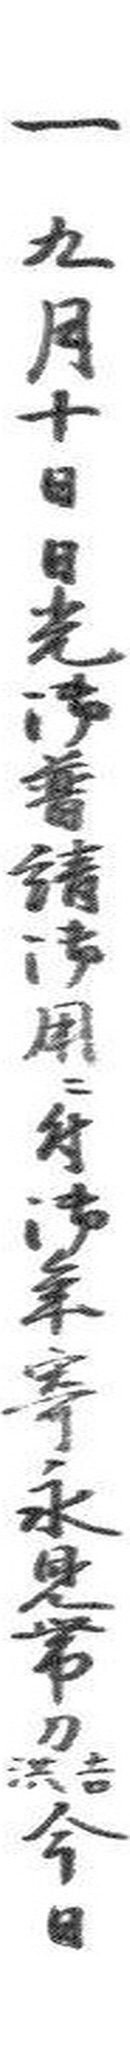一九月十日日光御普請御用ニ付御年寄永見帯刀吉洪今日
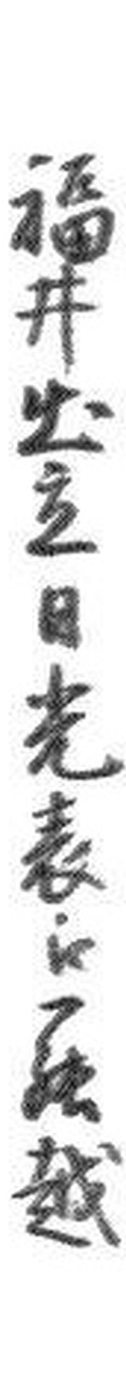福井出立日光表江罷越
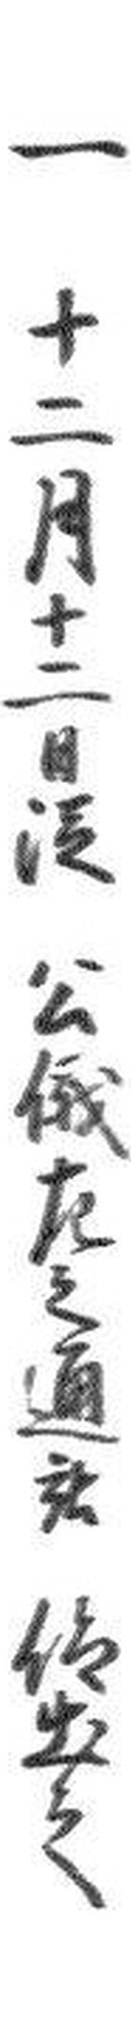一十二月十二日従公儀左之通被仰出之

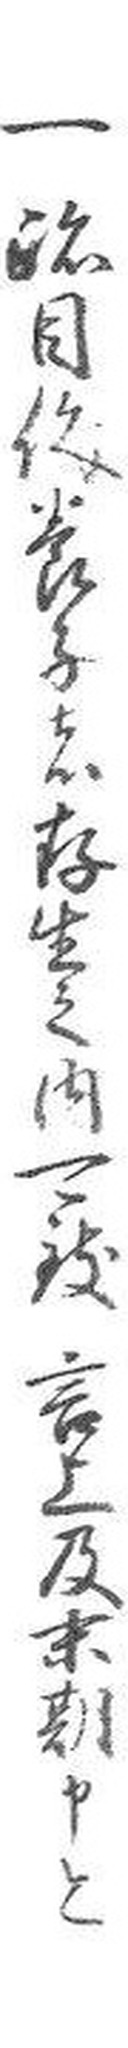一跡目儀養子者存生之内可致言上及末期中と
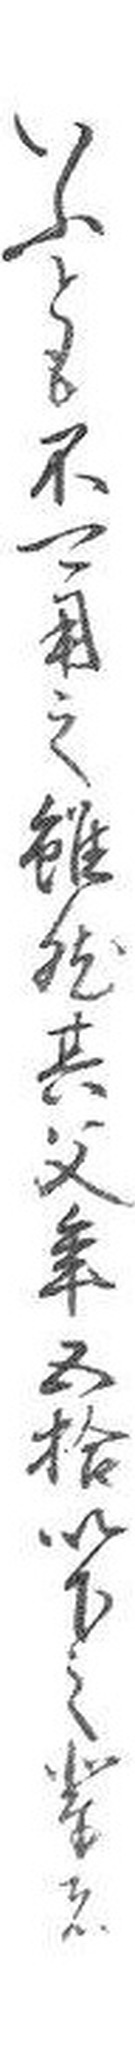いふとも不可用之雖然其父年五十以下之輩者
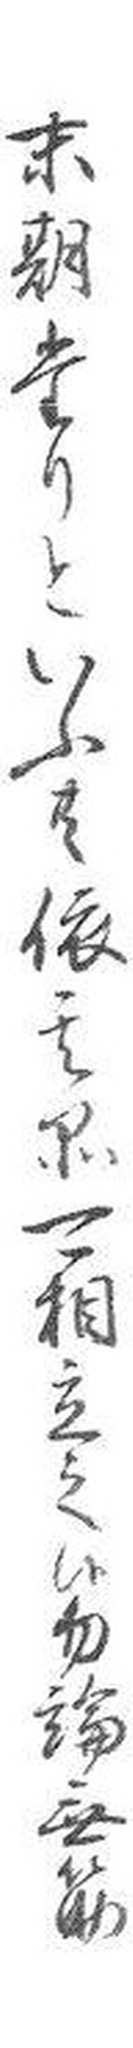末期たりといふ共依其品可相立之候勿論無筋
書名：家譜 五 光通公 従寛永十三年到万治二年
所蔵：福井県文書館 Fukui Prefectural Archives
